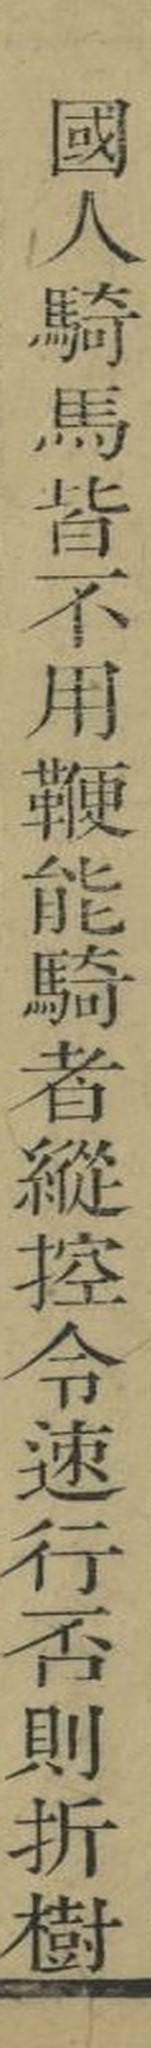国人騎馬皆不用鞭能騎者縦控令速行否則折樹
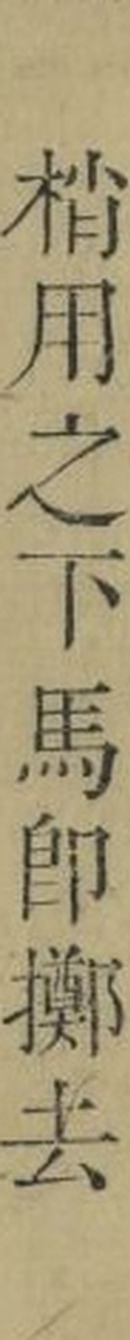梢用之下馬即擲去
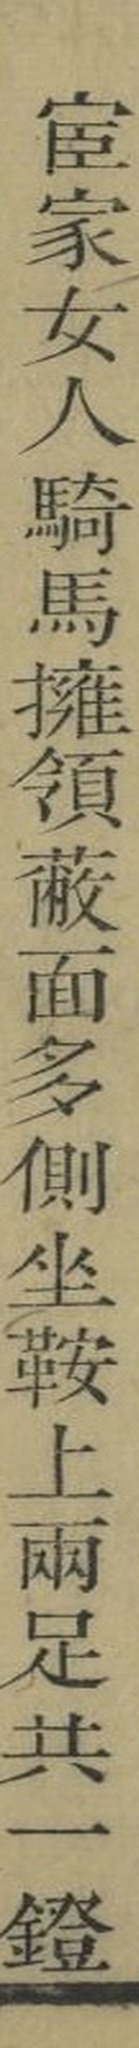宦家女人騎馬擁領蔽面多側坐鞍上両足共一鐙
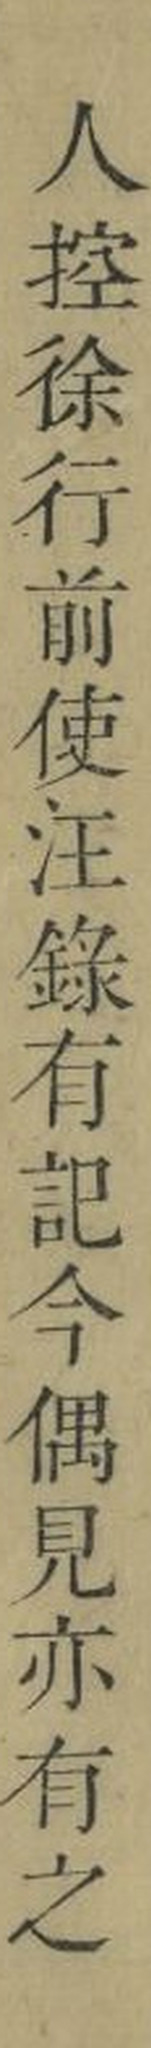人控徐行前使汪録有記今偶見亦有之
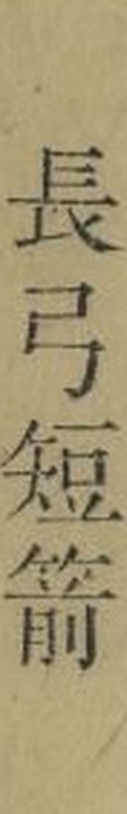長弓短箭

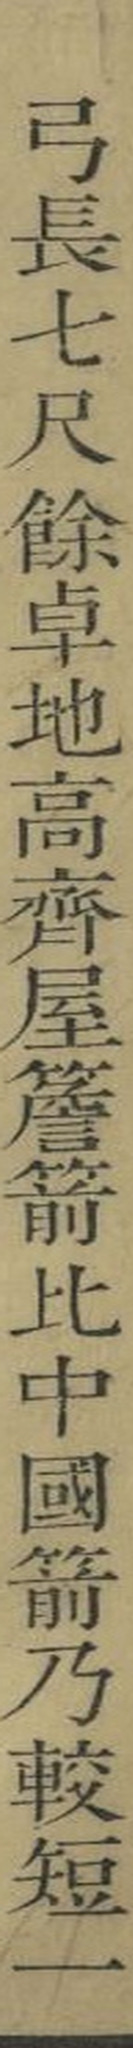弓長七尺余卓地高斉屋簷箭比中国箭乃較短一
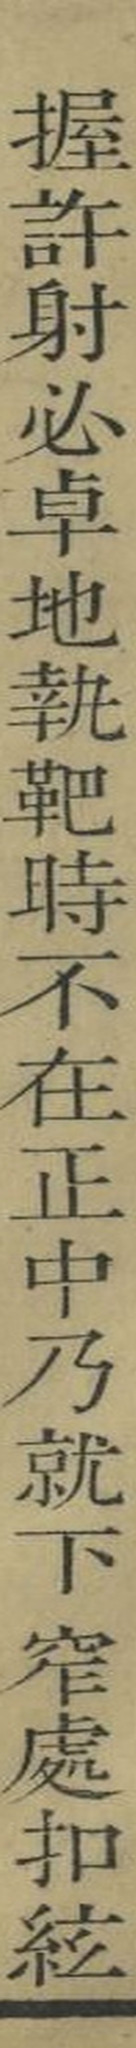握許射必卓地執靶時不在正中乃就下窄処扣絃
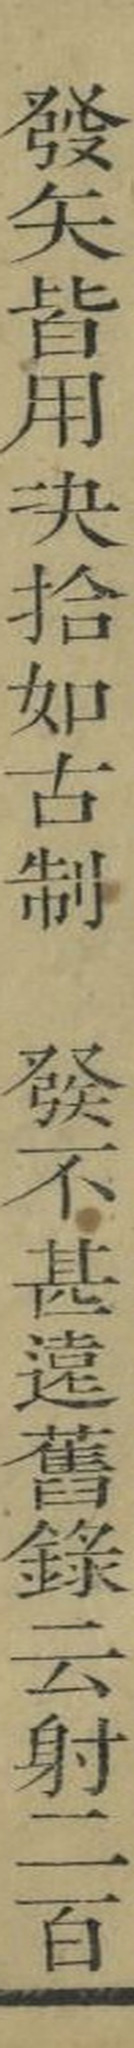発矢皆用決拾如古制発不甚遠旧録云射二百
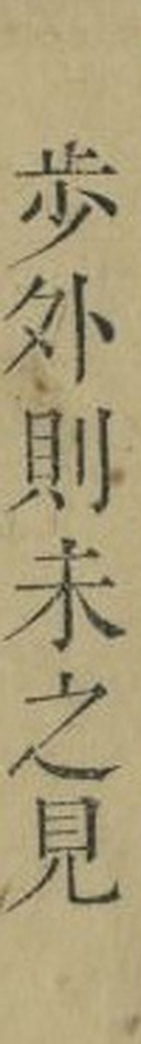歩外則未之見
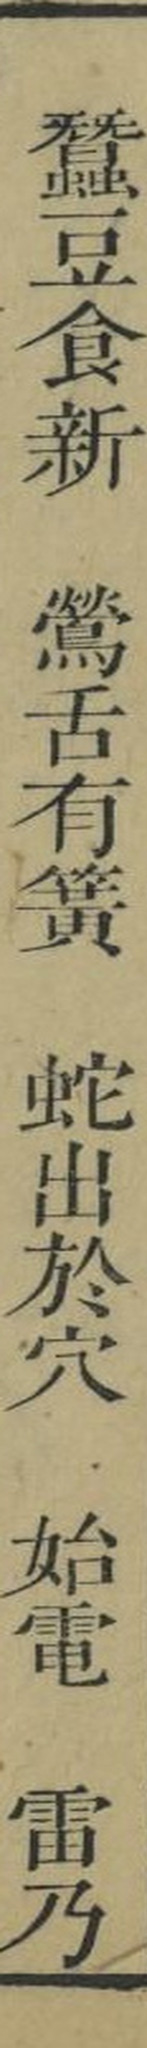蠶豆食新鶯舌有簧蛇出於穴始電雷乃
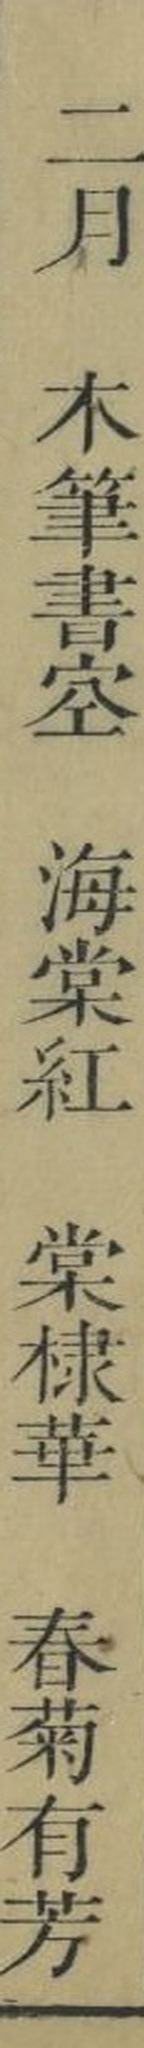二月木筆書空海棠紅棠棣華春菊有芳
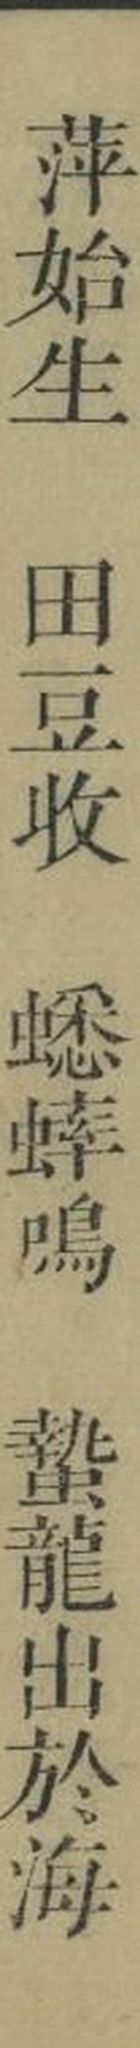萍始生田豆收蟋蟀鳴蟄竜出於海
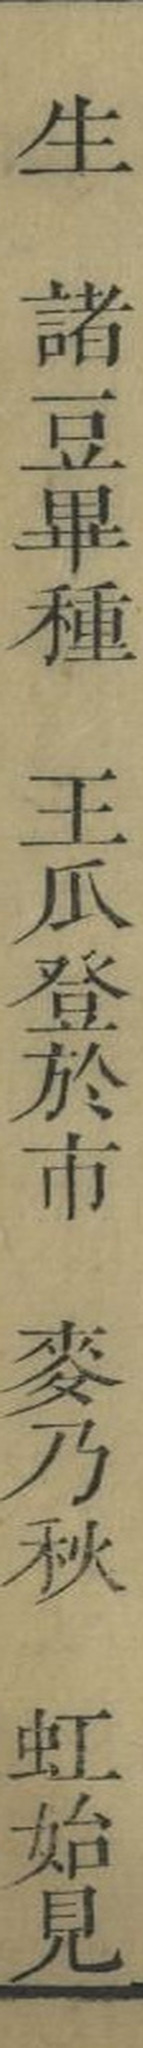生諸豆畢種王瓜登於市麦乃秋虹始見

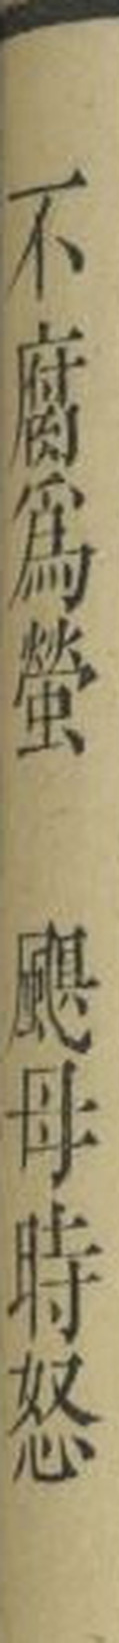不腐為蛍颶母時怒
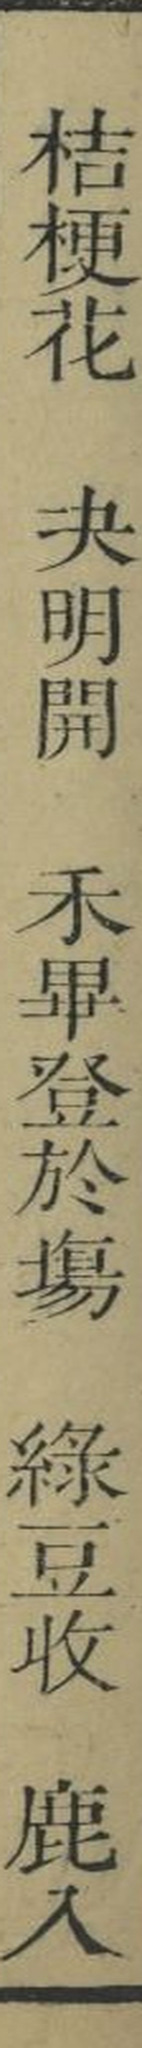桔梗花決明開禾畢登於場緑豆収鹿入

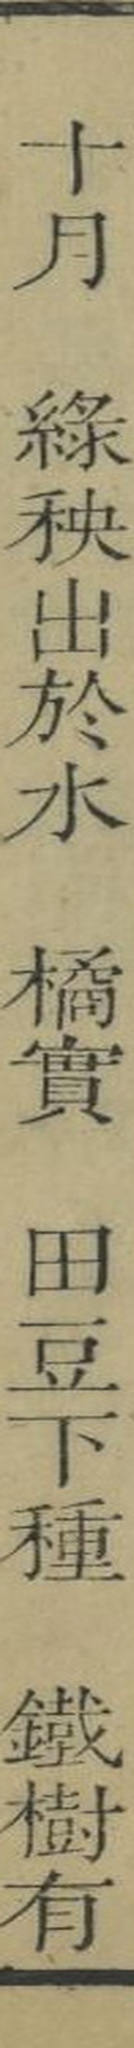十月緑秧出於水橘実田豆下種鉄樹有
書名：中山伝信録 巻六
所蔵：University of the Ryukyus Library
